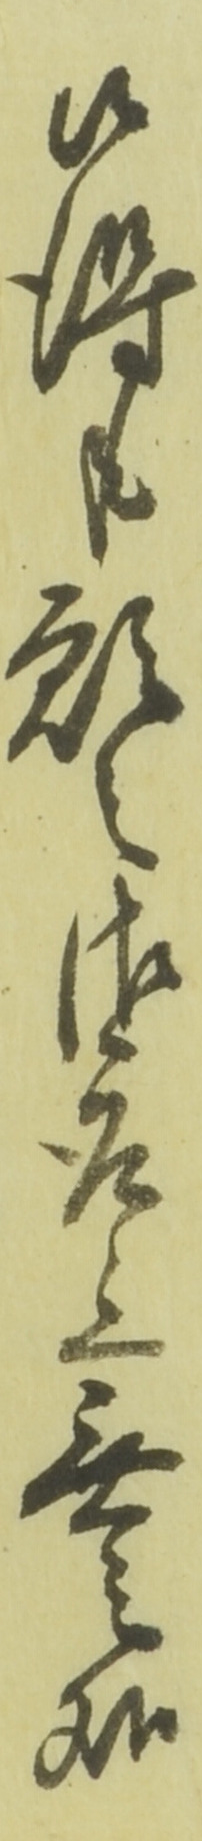候得共願之御取上無之処
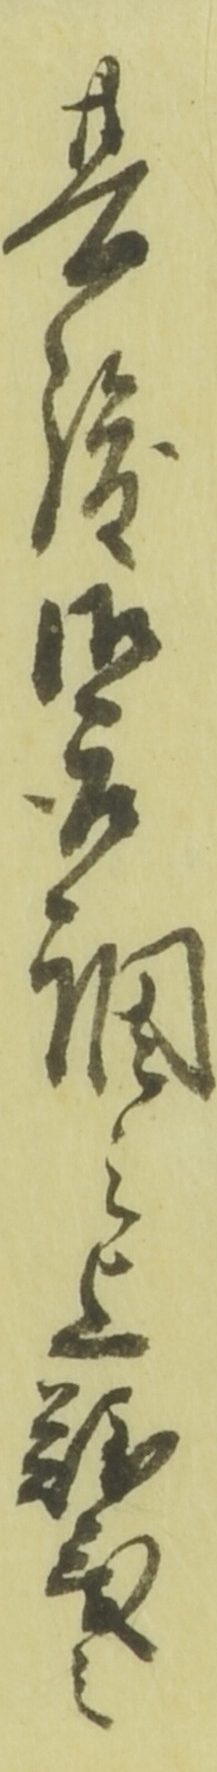其後御取調之上難義之
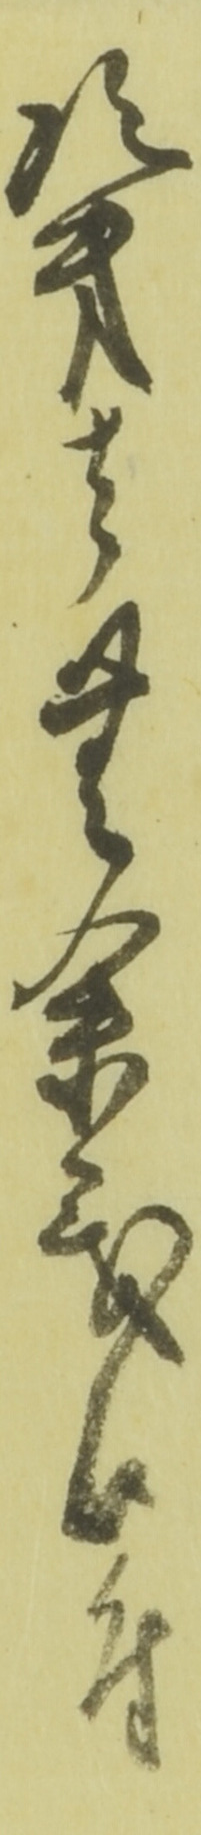次第は無余義候付
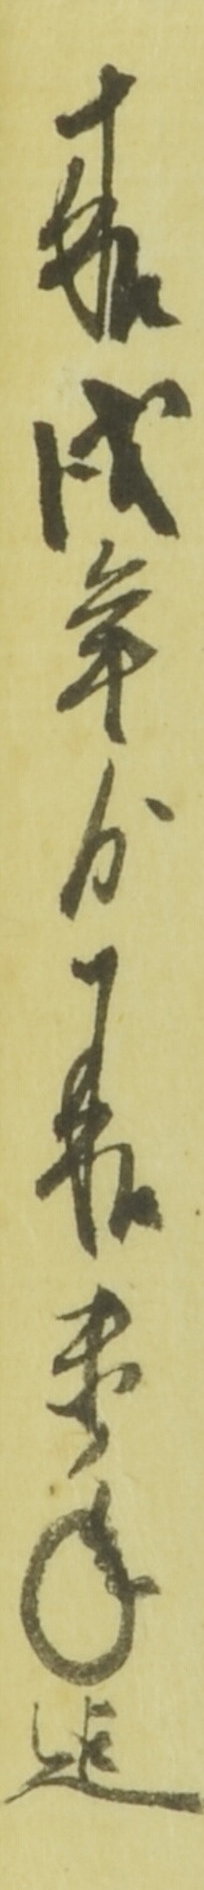来戌年ゟ来ル未年迄
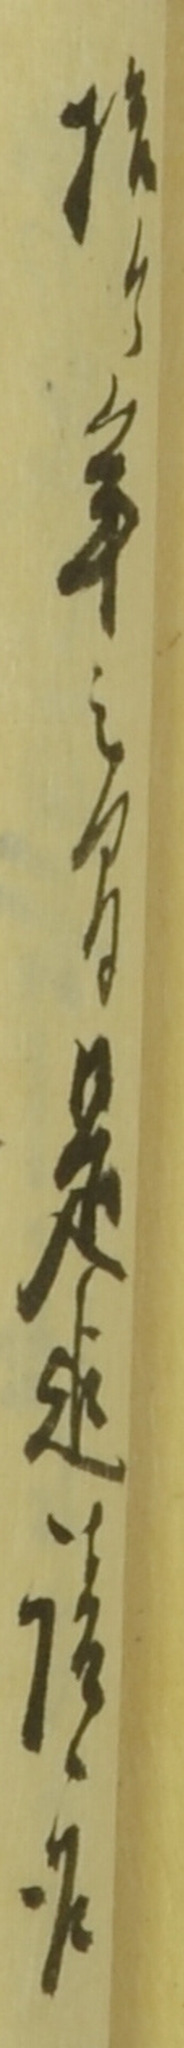拾ヶ年之間是迄請取
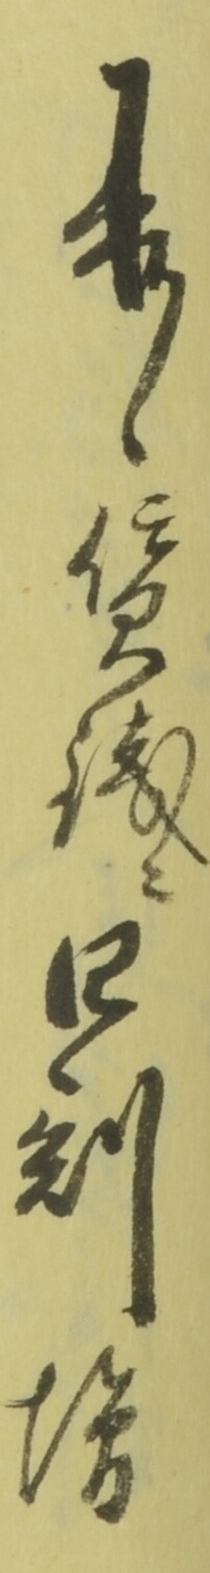来候賃銭ニ四割増
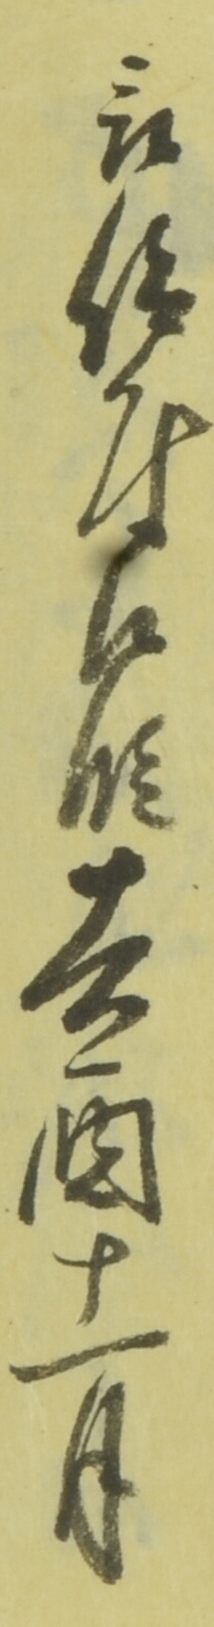被仰付候段去酉十一月

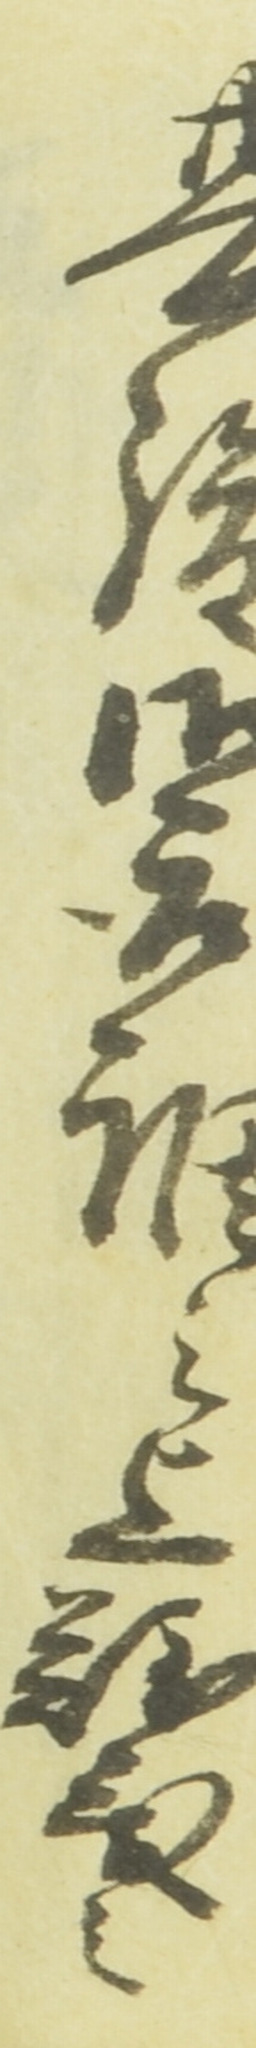其後御取調之上難義之
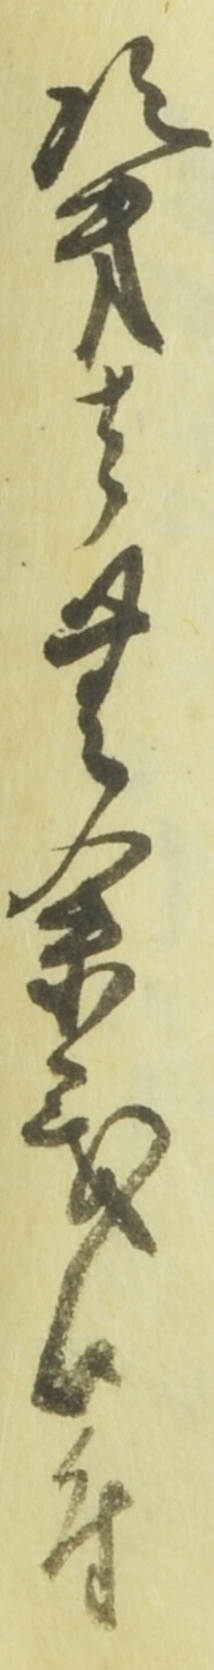次第は無余義候付
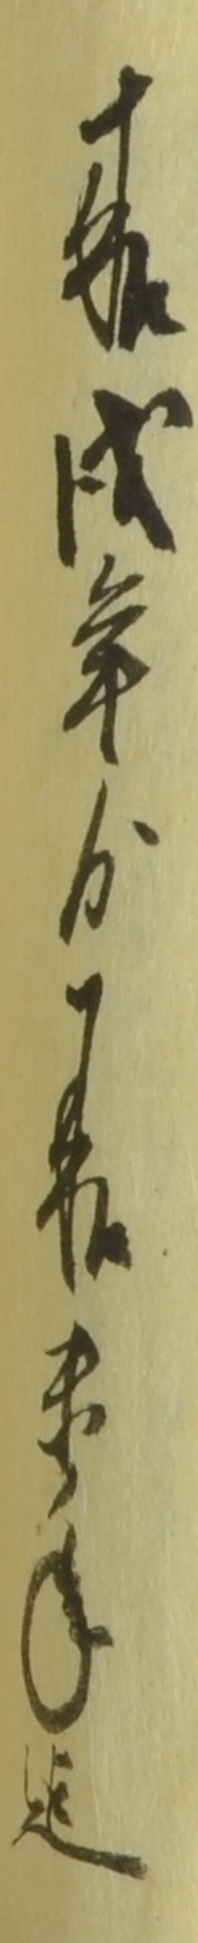来戌年ゟ来ル未年迄
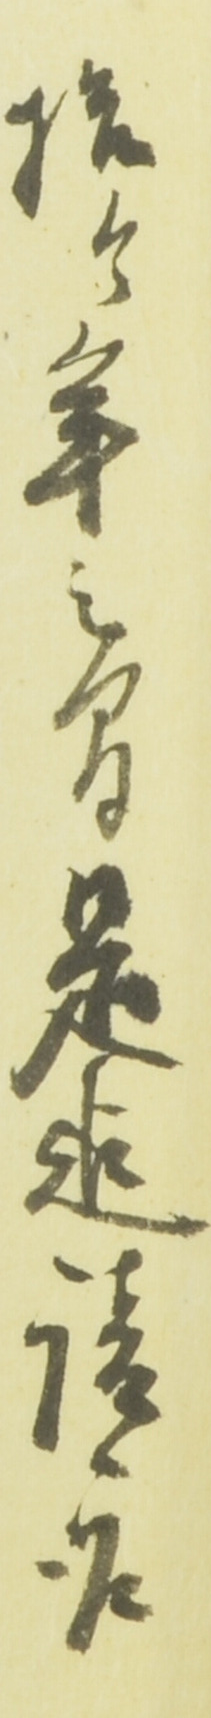拾ヶ年之間是迄請取
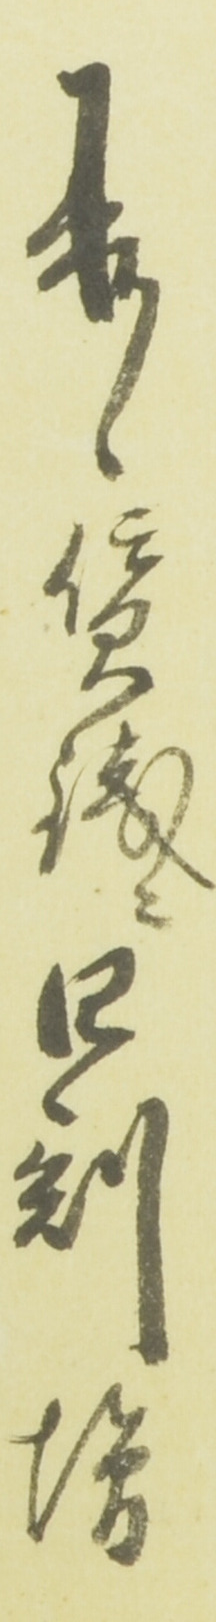来候賃銭ニ四割増
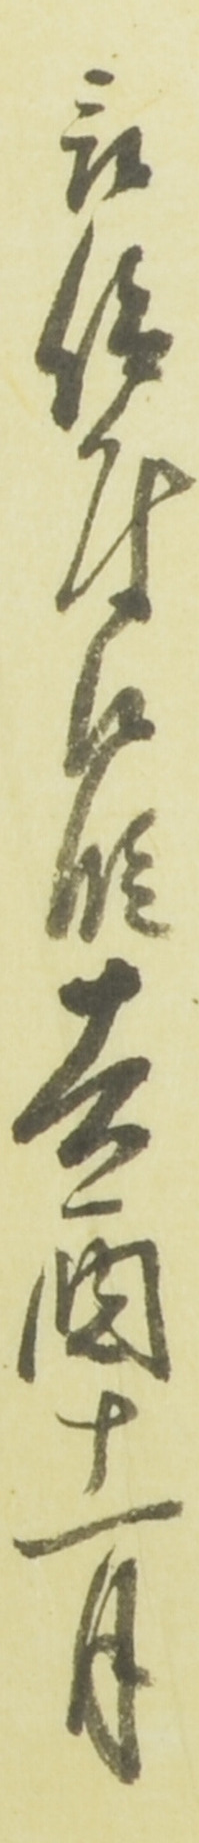被仰付候段去酉十一月
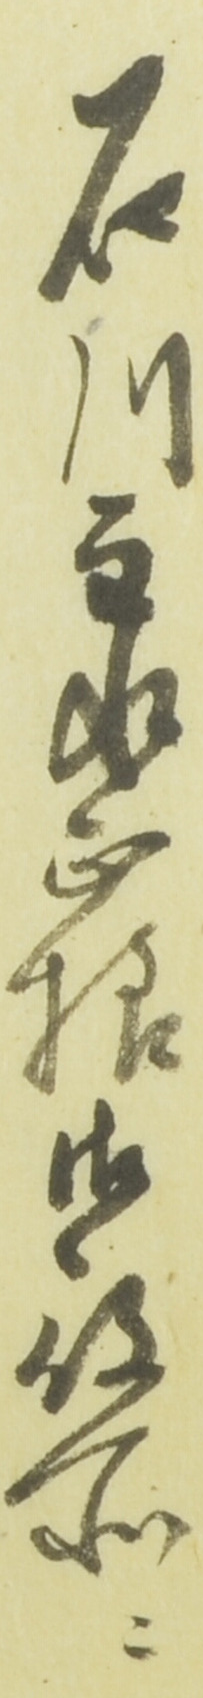石川主水正様御役所ニ
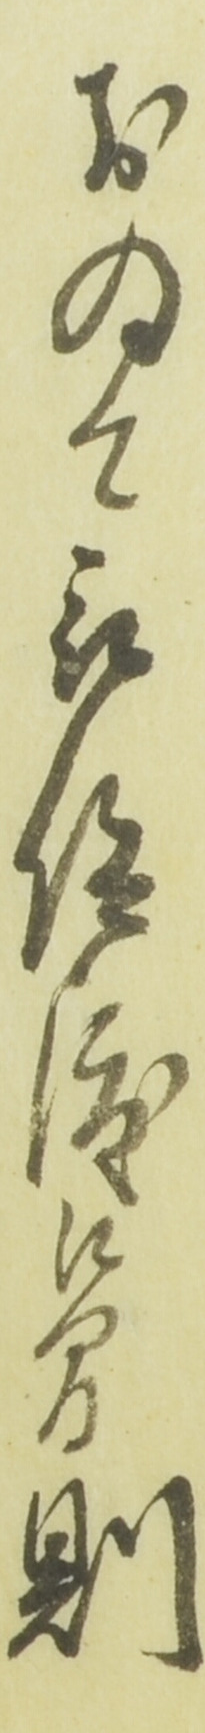おゐて被仰渡候間則
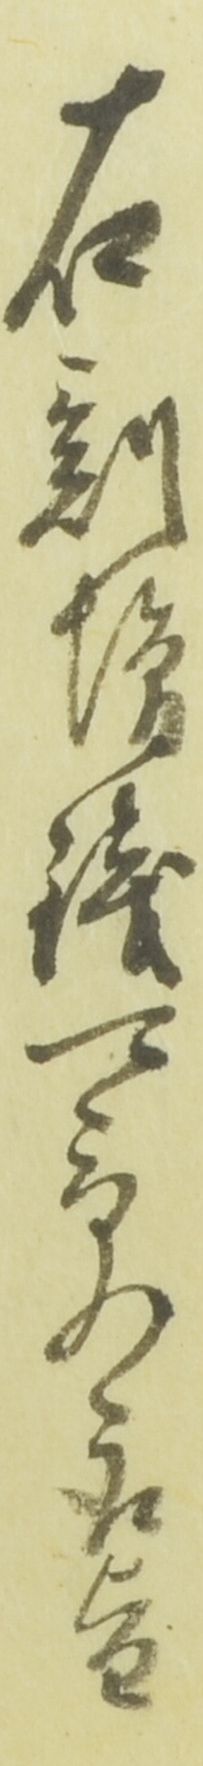右割増銭可受取旨
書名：御触書御書附控
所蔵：伊那市立高遠町図書館・合同会社AMANE
